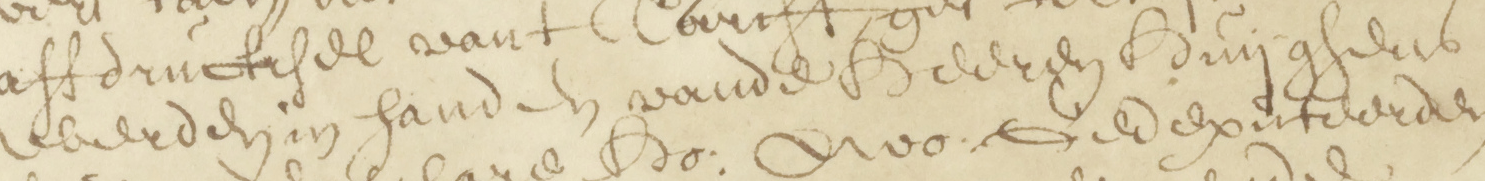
werden in handen vande Heeren Huijghens
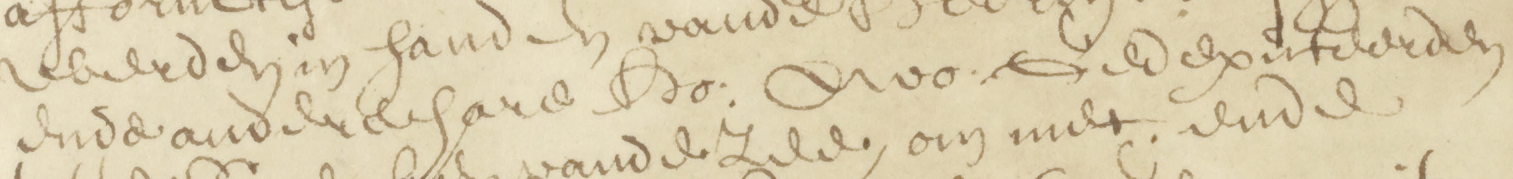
ende andere hare Ho:Mo: Gedeputeerden
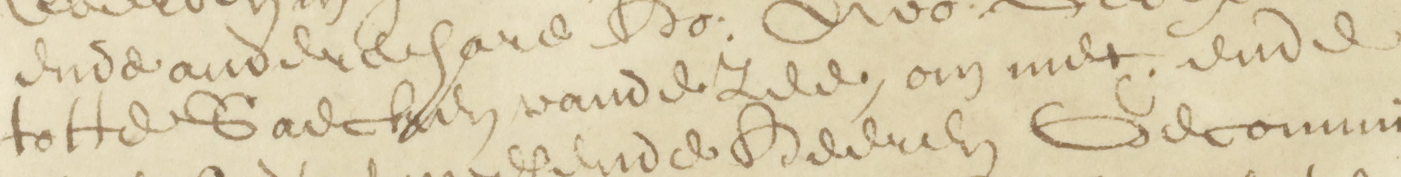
totte Saecken vande Zee, om met, ende
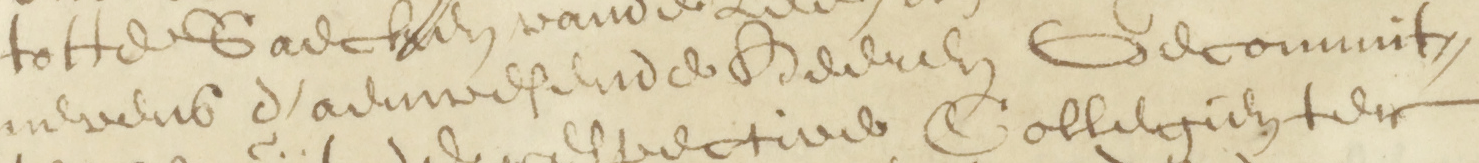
nevens d'aenwesende Heeren Gecommit„
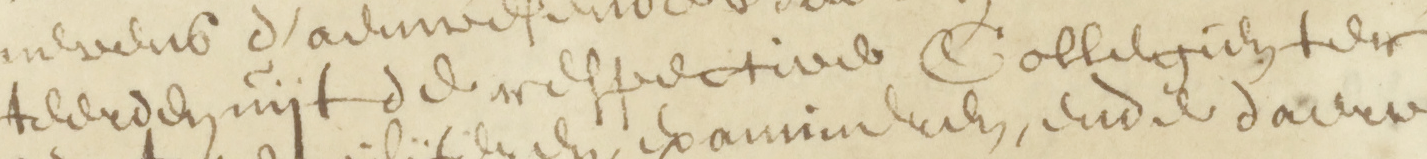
teerden uijt de respective Collegien ter
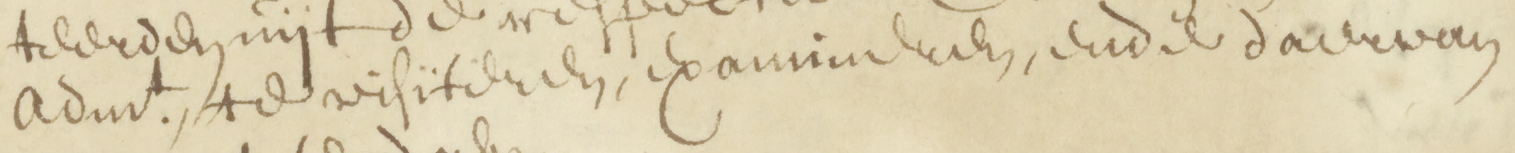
Admt. te visiteren, examineren, ende daervan
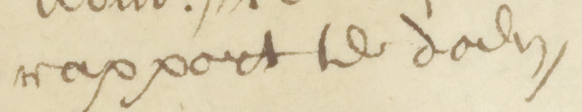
rapport te doen.
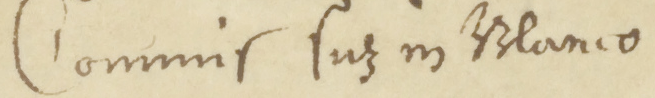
Commissien in Blanco
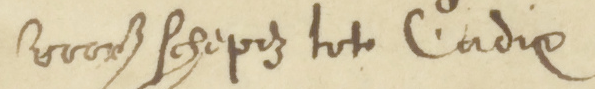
voor schepen tot Cadix
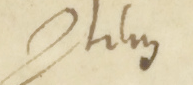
Item
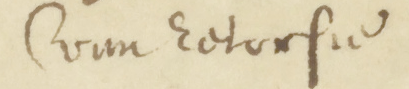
van retorsie
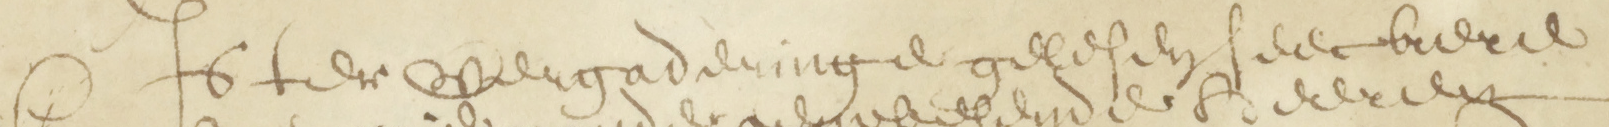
Is ter Vergaderinge gelesen seeckere
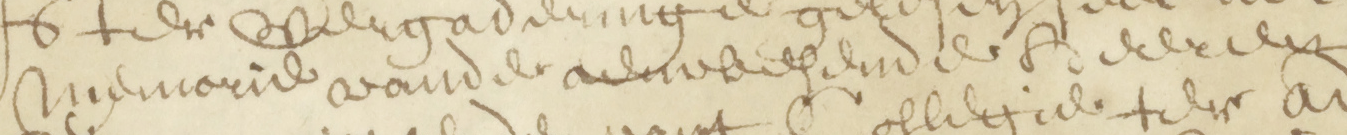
Memorie vande aenwesende Heeren
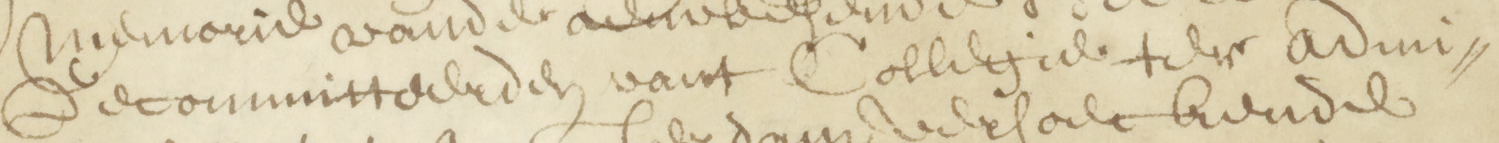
Gecommitteerden vant Collegie ter Admi„
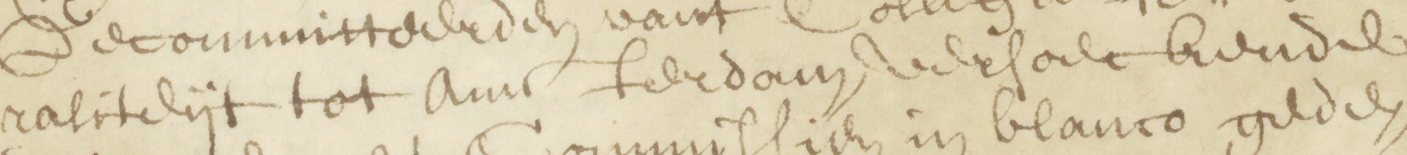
raliteijt tot Amsterdam, versoeckende
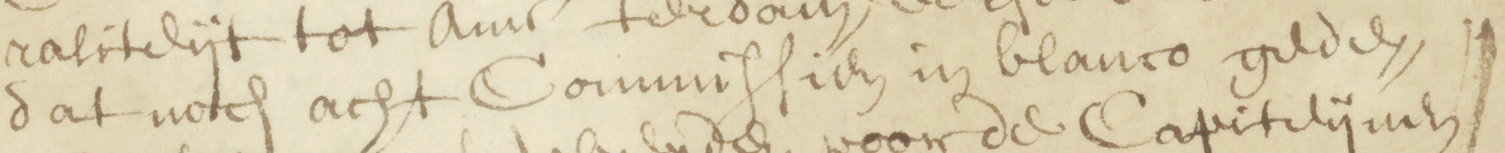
dat noch acht Commissien in blanco gede„
